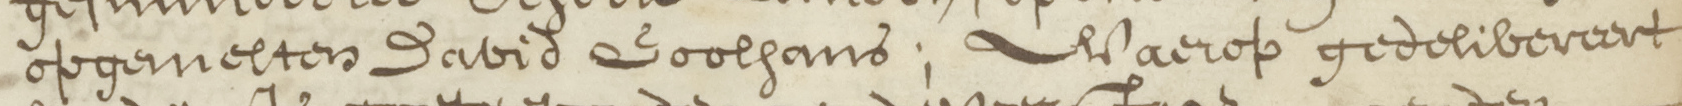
opgemelten David Coolhans; Waerop gedelibereert
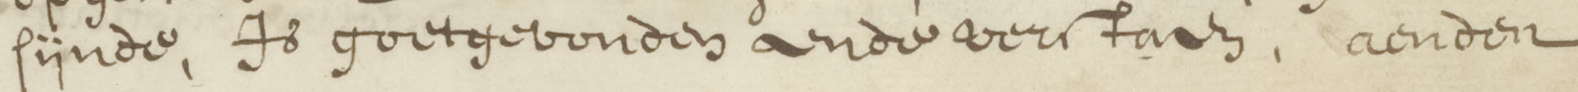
sijnde, Is goetgevonden ende verstaen, aenden
